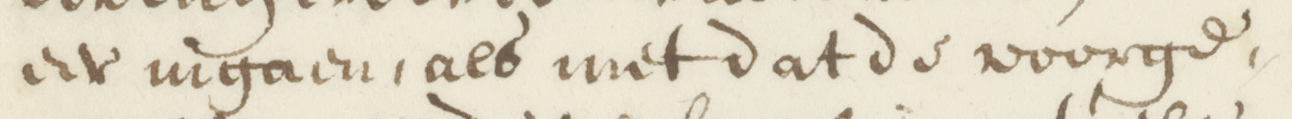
eer ingaen, als met dat de voorge„
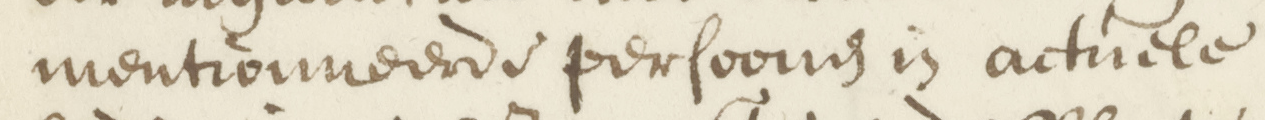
mentionneerde persoonen in actuele
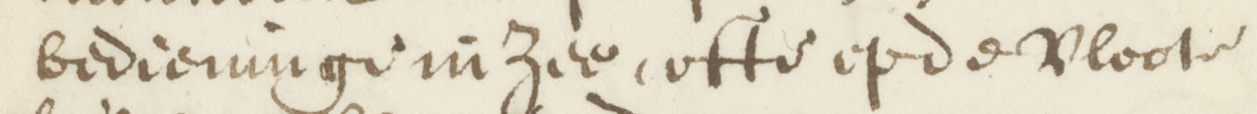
bedieninge in Zee, ofte opde Vloote
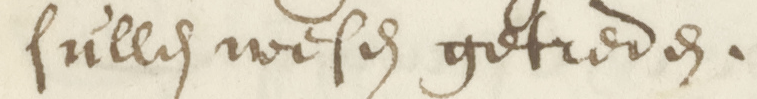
sullen wesen getreden.
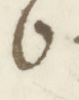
6.
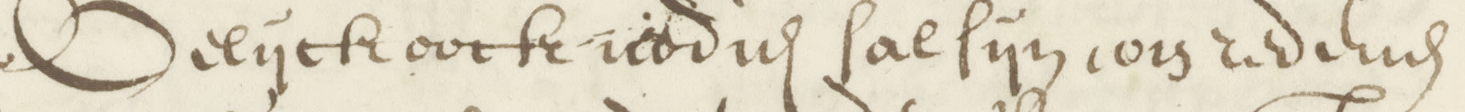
Gelijck oock nodich sal sijn, om redenen
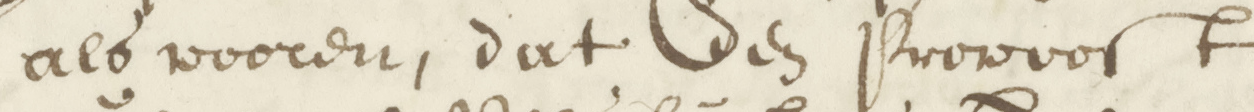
als vooren, dat den Provoost
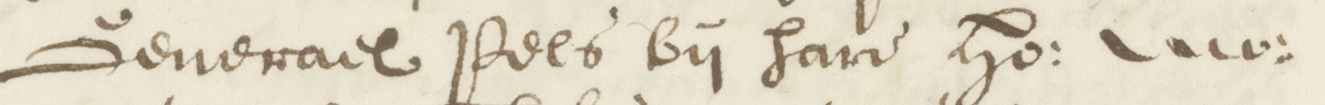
Generael Pels bij hare Ho:mo:
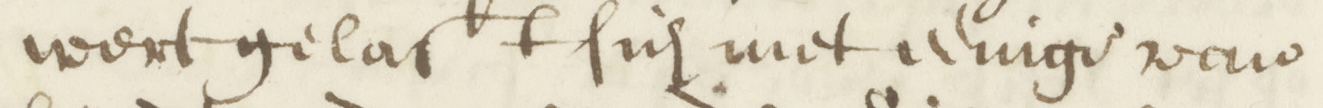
wert gelast sich met eenige van
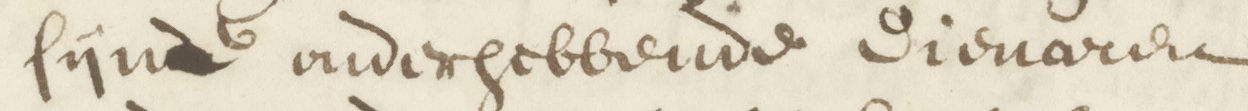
sijne onderhebbende dienaren
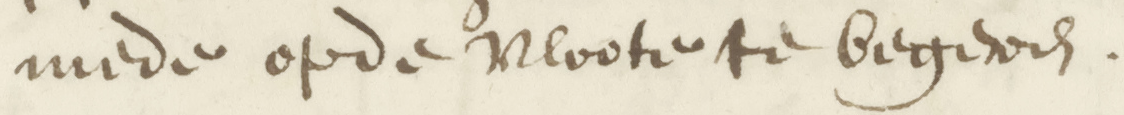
mede opde Vloote te begeven.
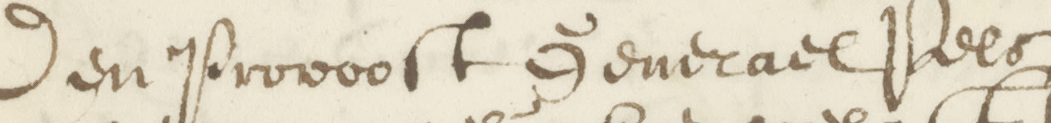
Den Provoost Generael Pels
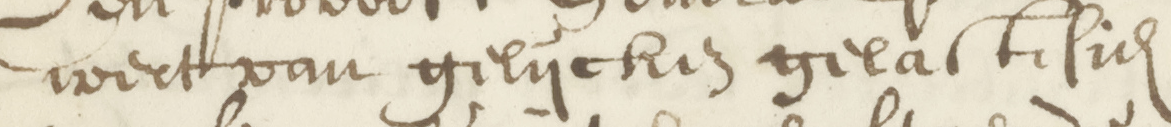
wert van gelijcken gelast sich
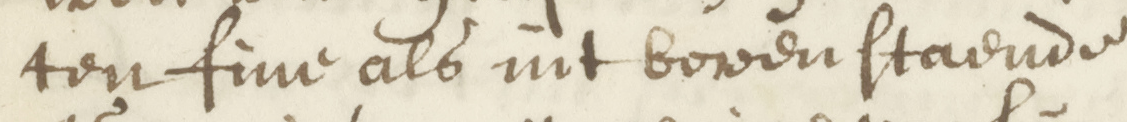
ten fine als int boven staende
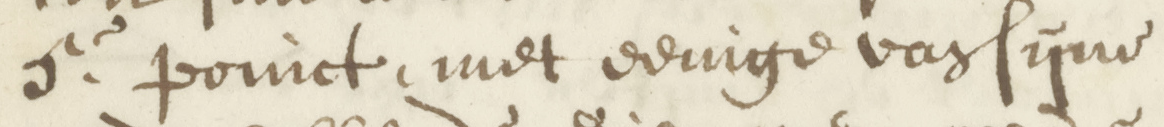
5e poinct, met eenige van sijne
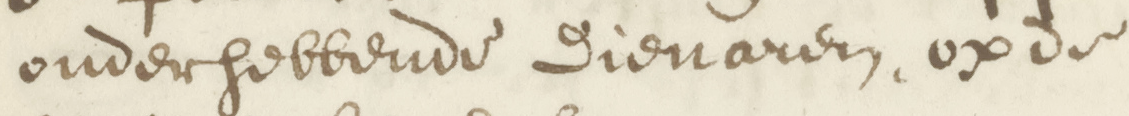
onderhebbende dienaren, op de
